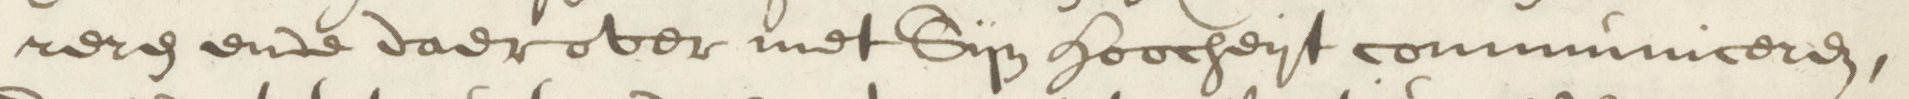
reren ende daerover met Sijn Hoocheijt comunniceren.
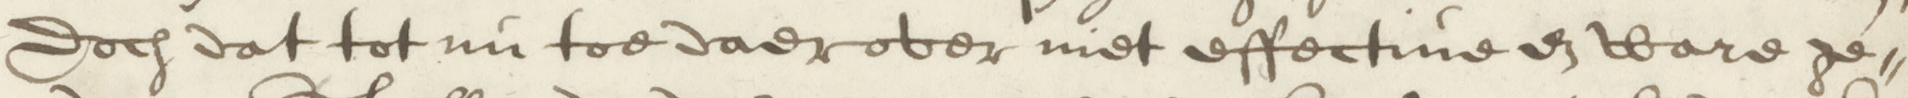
Doch dat tot nu toe daer over niet effectiue en ware ge„
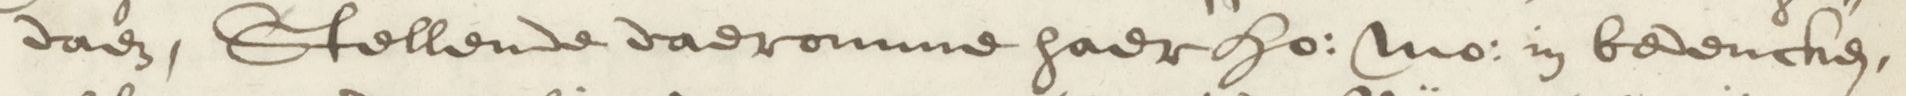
daen, Stellende daeromme haer Ho:Mo: in bedencken,
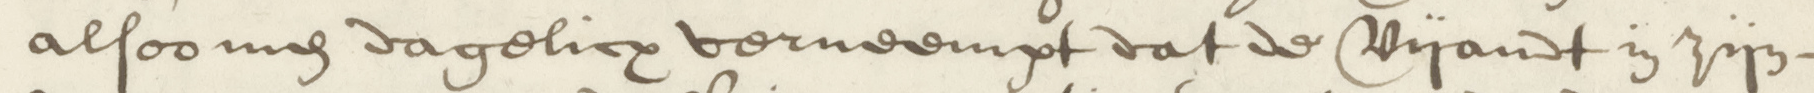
alsoo men dagelicx verneempt dat de Vijandt in zijn
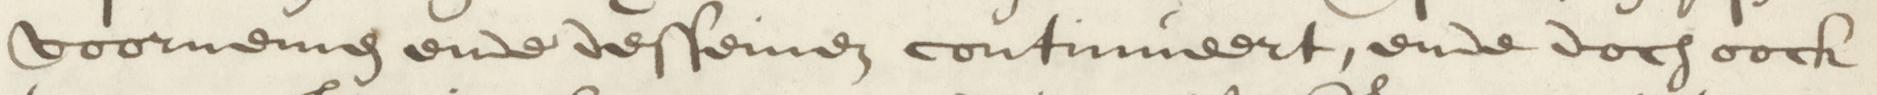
voornemen ende desseinen continueert, ende doch oock
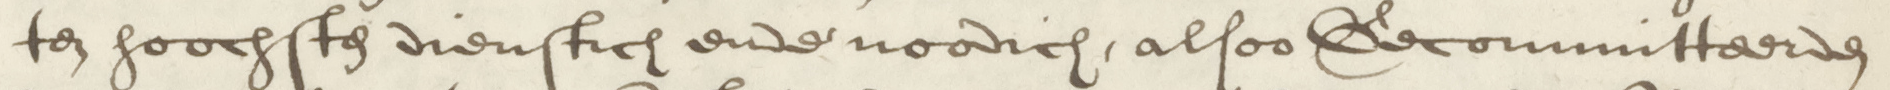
ten hoochsten dienstich ende noodich, alsoo Gecommitteerden
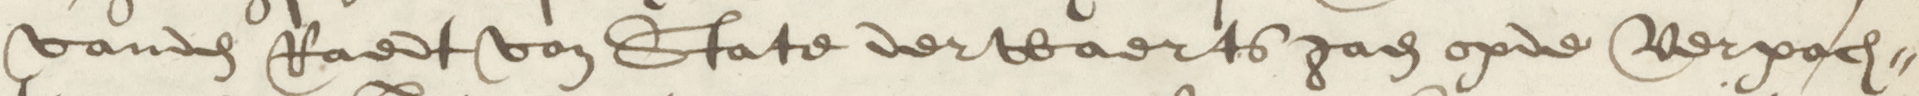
vanden Raedt van State derwaerts gaen opde Verpach„
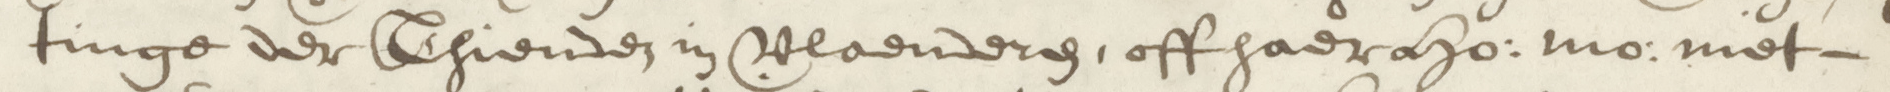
tinge der Thienden in Vlaenderen, off haer Ho:Mo: niet —
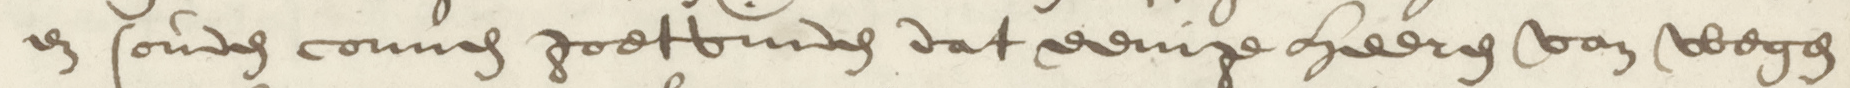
en souden connen goetvinden dat eenige Heeren van wegen
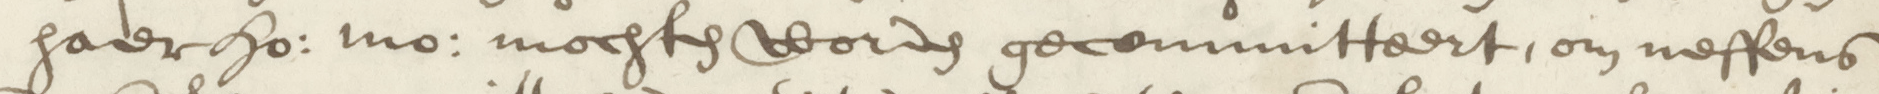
haer Ho:Mo: mochten worden gecommitteert, om neffens
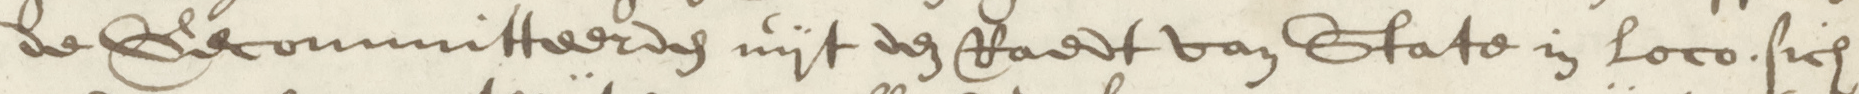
de Gecommitteerden uijt den Raedt van State in loco, sich
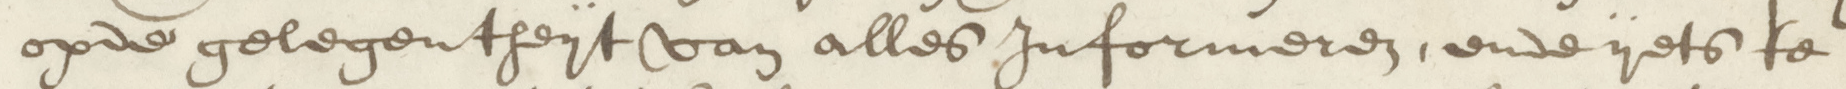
opde gelegentheijt van alles Informeren, ende ijets te
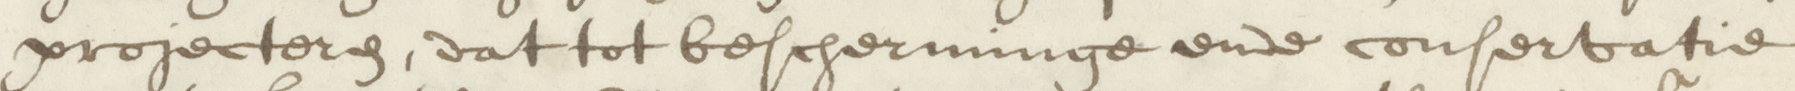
projecteren, dat tot bescherminge ende conservatie
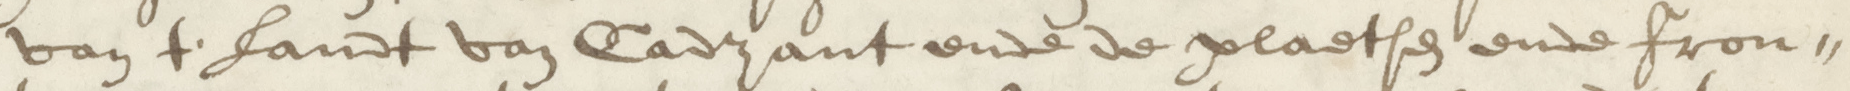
van t'Landt van Cadzant ende de plaetsen ende fron„
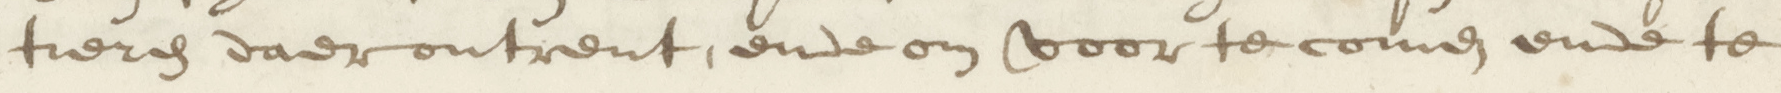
tieren daerontrent, ende om voor te comen ende te
